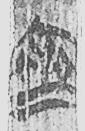齊
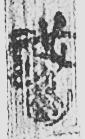{戠頁}
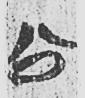公
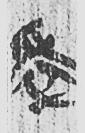卒B
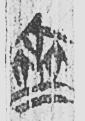齊
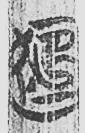𧻚
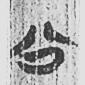公
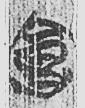會
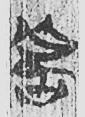者
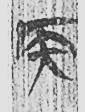侯
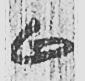㠯（以）
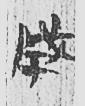成
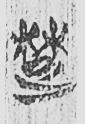楚
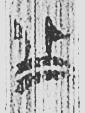丘
